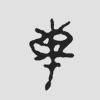東
